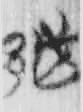○（越）
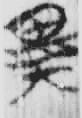異
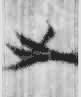之
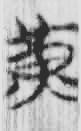黃
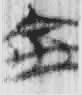金
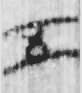五
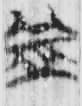益
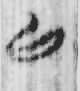㠯（以）
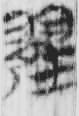翟（糴）
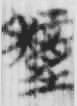穜（種）
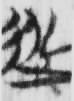迄
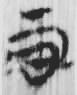○（期）
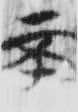不
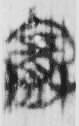賽
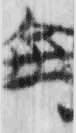金
